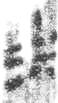亓（其）
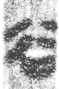谷（欲）
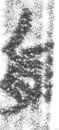能
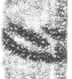又
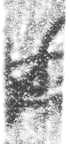弃
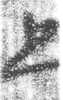也
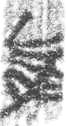能
